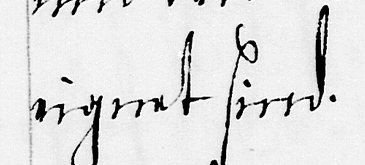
eignet sind.
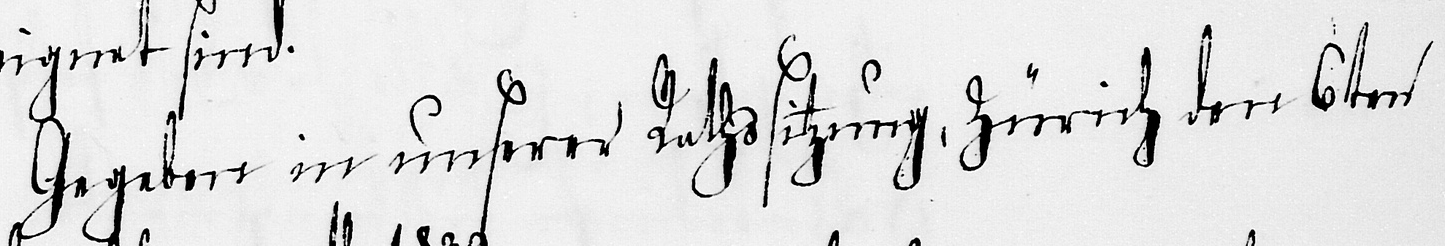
Gegeben in unserer Rathssitzung, Zürich den 6ten
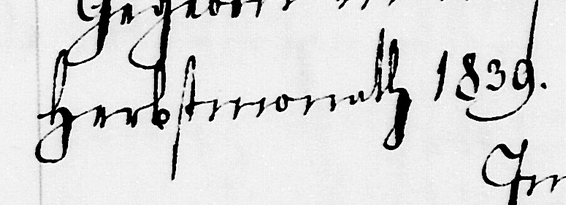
Herbstmonath 1839.
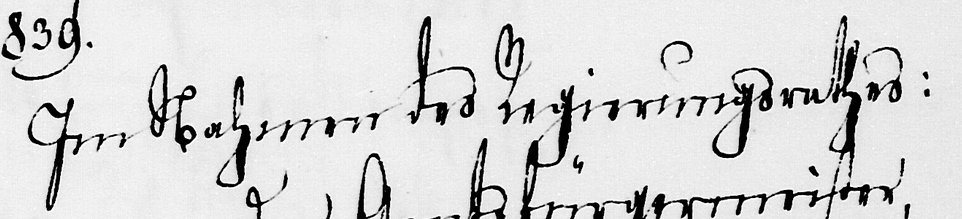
Im Nahmen des Regierungsrathes:
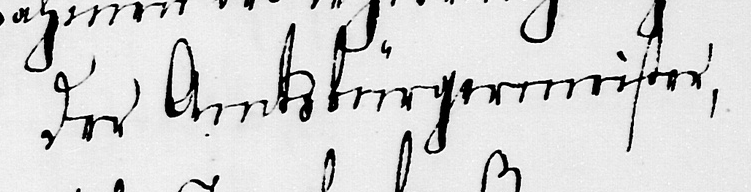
Der Amtsbürgermeister,
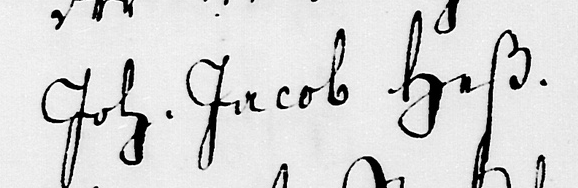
Joh. Jacob Heß.
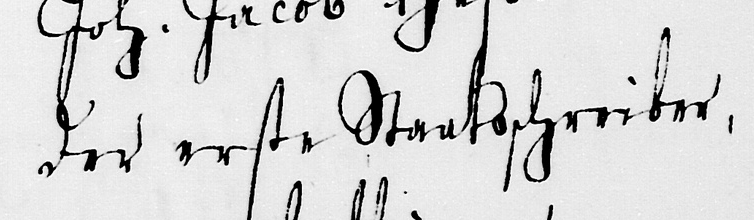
Der erste Staatsschreiber,
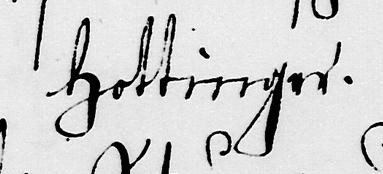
Hottinger.
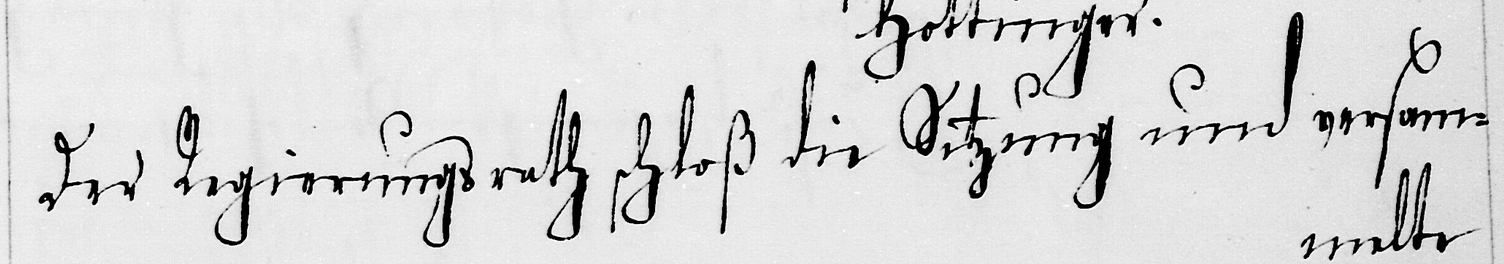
Der Regierungsrath schloß die Sitzung und versam-
